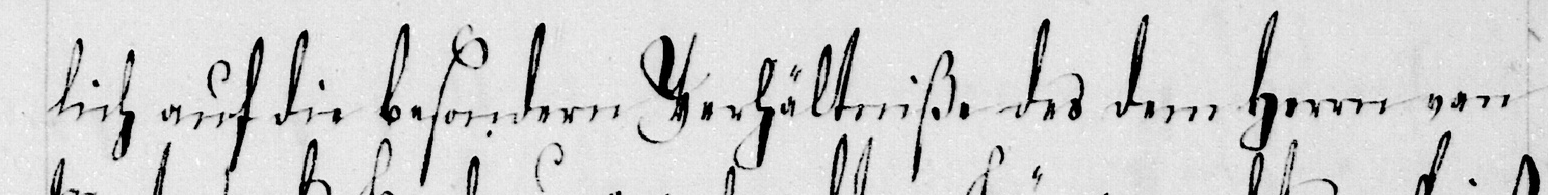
lich auf die besondern Verhältniße des dem Herrn van
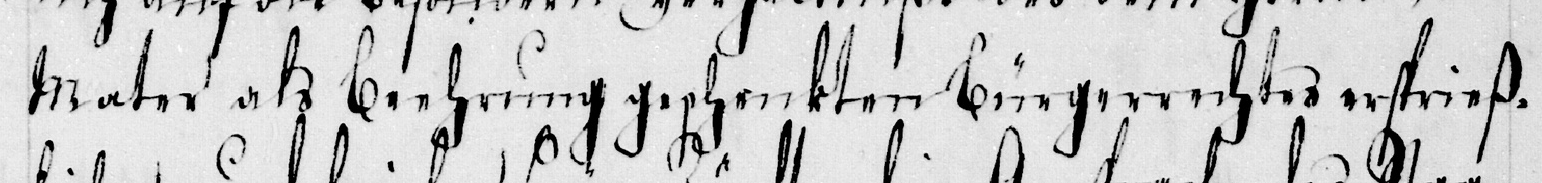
Mater als Beehrung geschenkten Bürgerrechtes ersprieß¬
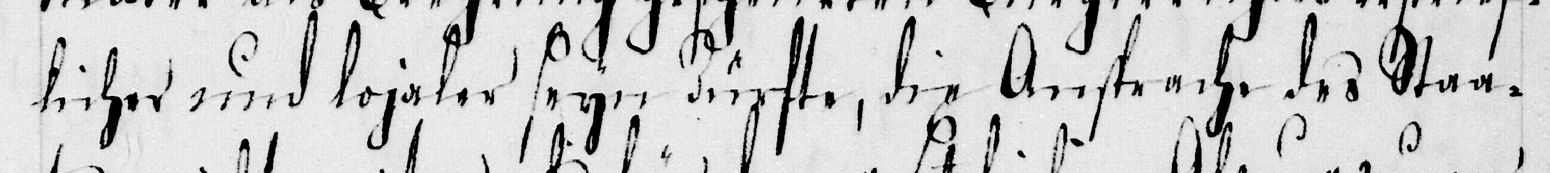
licher und lojaler seyn dürfte, die Ansprache des Staa¬
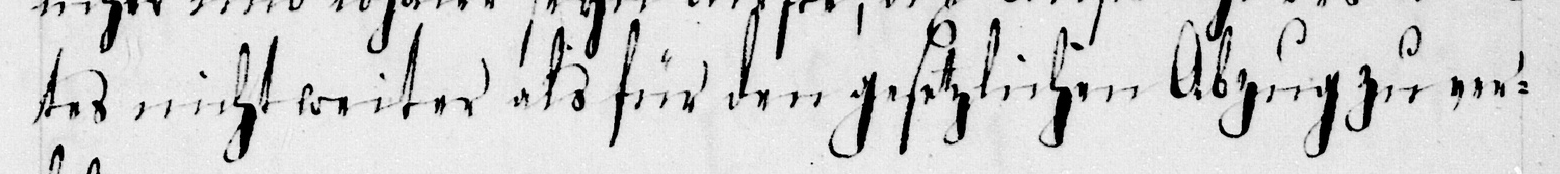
tes nicht weiter als für den gesetzlichen Abzug zu ver¬
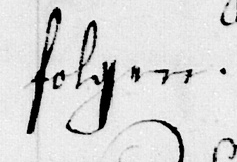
folgen.
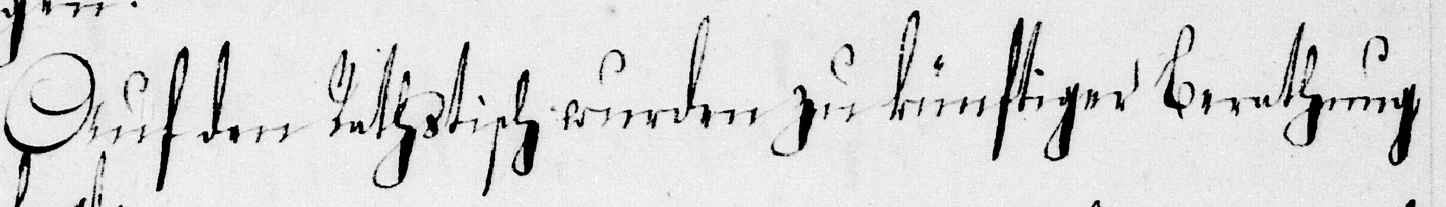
Auf den Rathstisch wurden zu künftiger Berathung
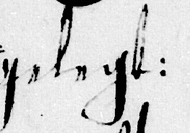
gelegt:
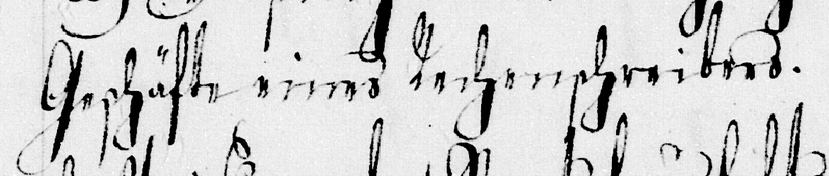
Geschäfte eines Rechenschreibers.
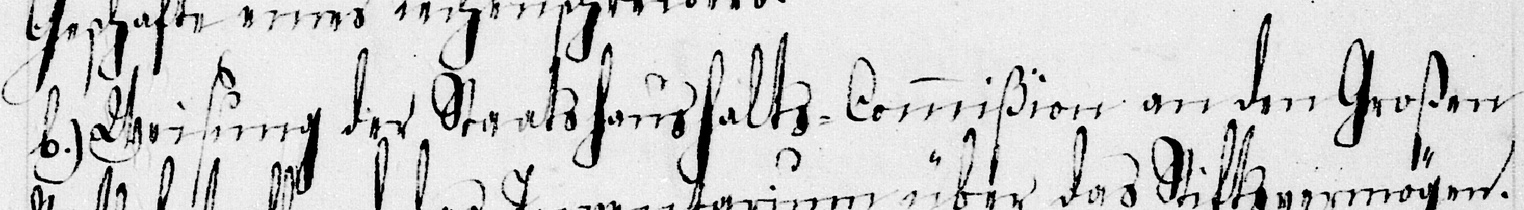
b.) Weisung der Staatshaushalts-Commißion an den Großen
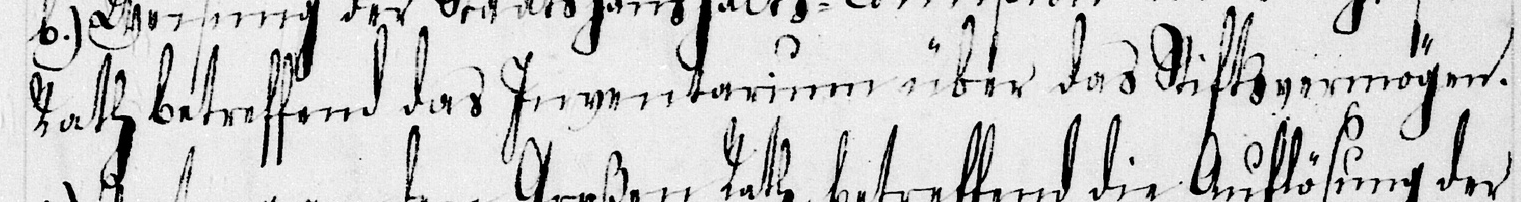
Rath betreffend das Inventarium über das Stiftsvermögen.
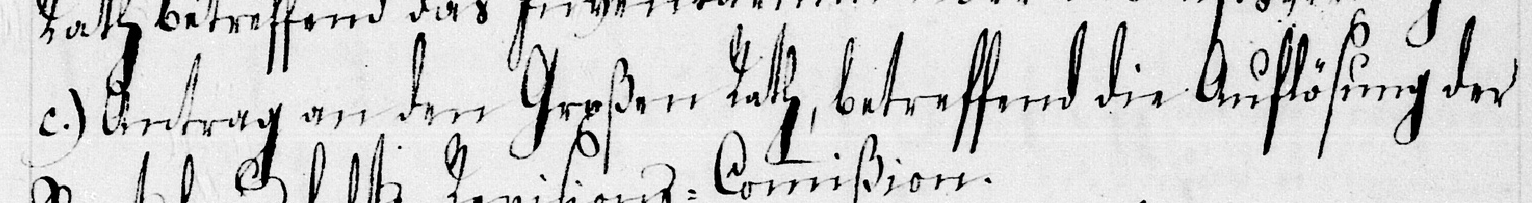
c.) Antrag an den Großen Rath, betreffend die Auflösung der
